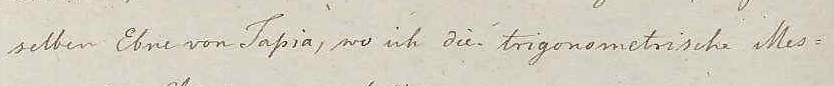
selben Ebne von Tapia, wo ich die trigonometrische Mes-
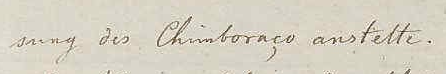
sung des Chimboraço anstelte.
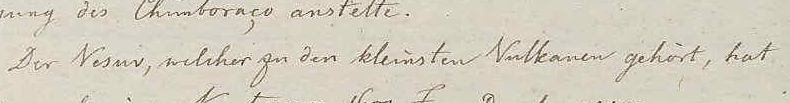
Der Vesuv, welcher zu den kleinsten Vulkanen gehört, hat
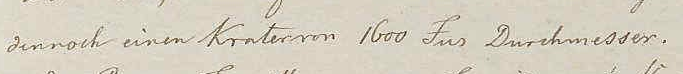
dennoch einen Krater von 1600 Fus Durchmesser.
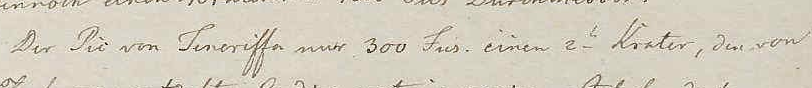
Der Pic von Teneriffa nur 300 Fus. 2￼ Krater, den von
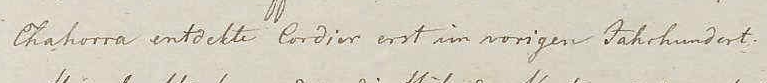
Chahorra entdekte Cordier erst im vorigen Jahrhundert.
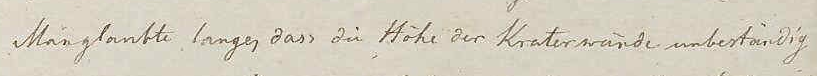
Man glaubte lange, dass die Höhe der Kraterwände unbeständig
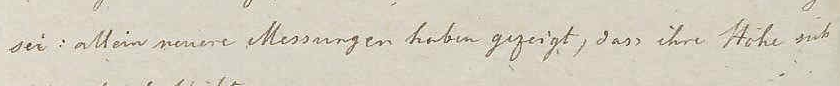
sei: allein neuere Messungen haben gezeigt, dass ihre Höhe sich
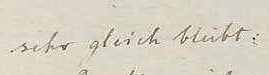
sehr gleich bleibt:
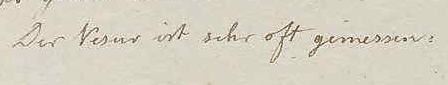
Der Vesuv ist sehr oft gemessen:
